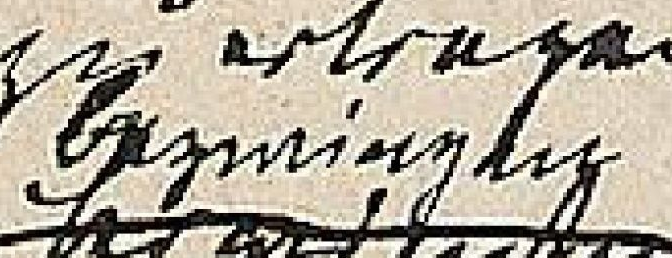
bezwingen
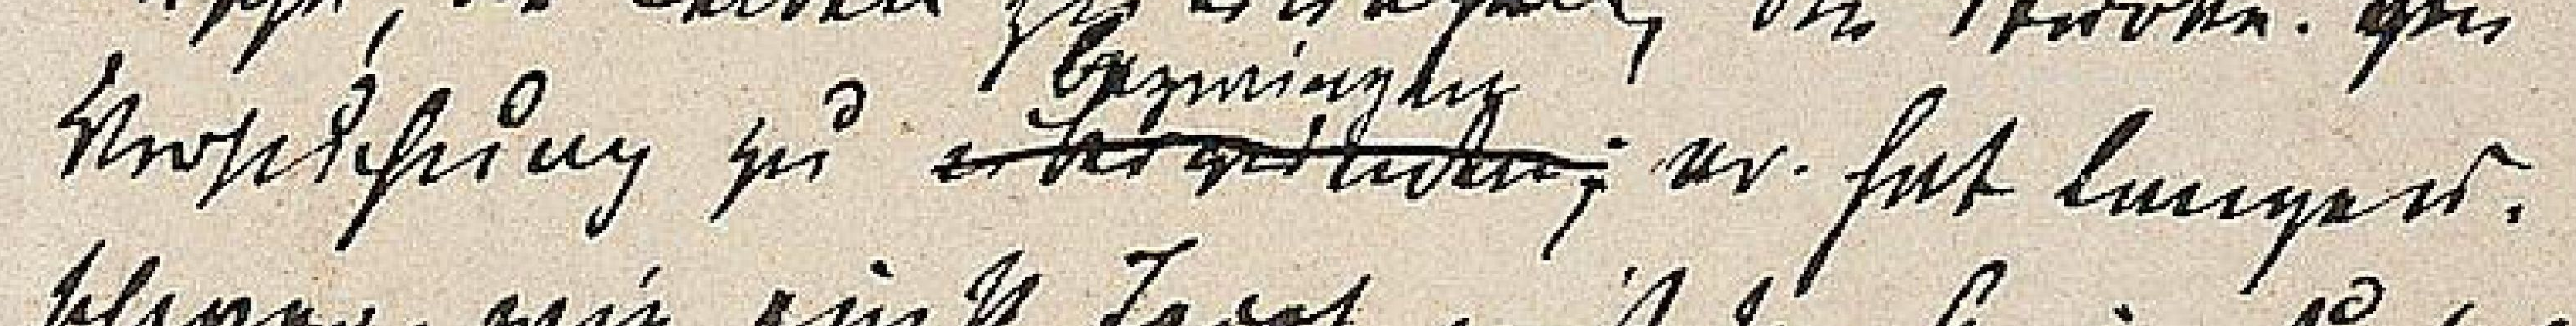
Versuchung zu überwinden; er hat lange u.
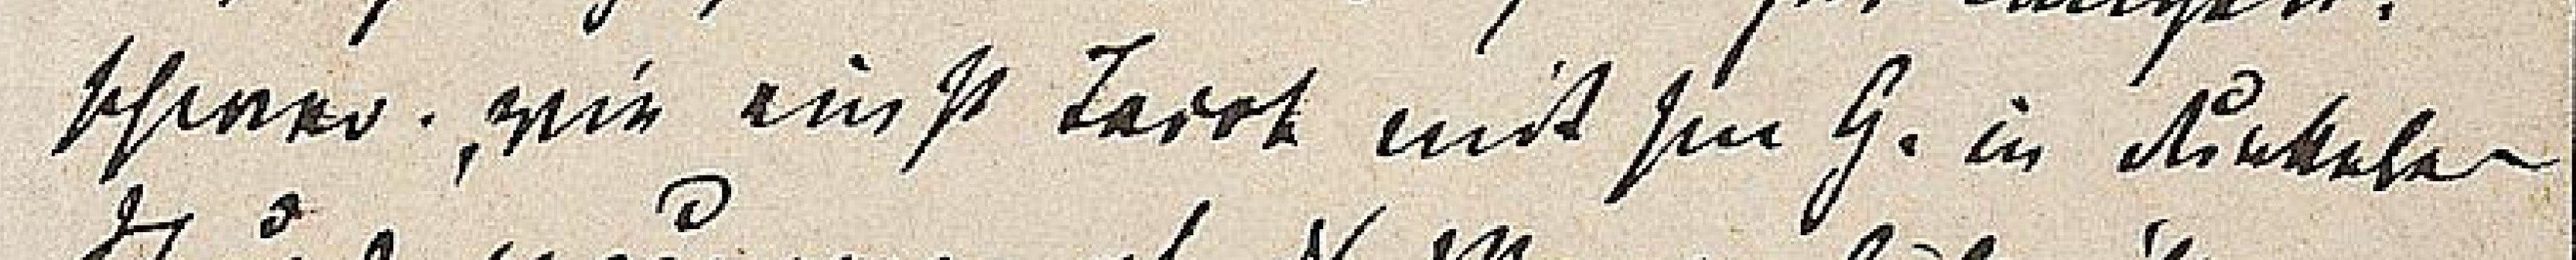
schwer, wie einst Jacob mit sm G. in dunkler
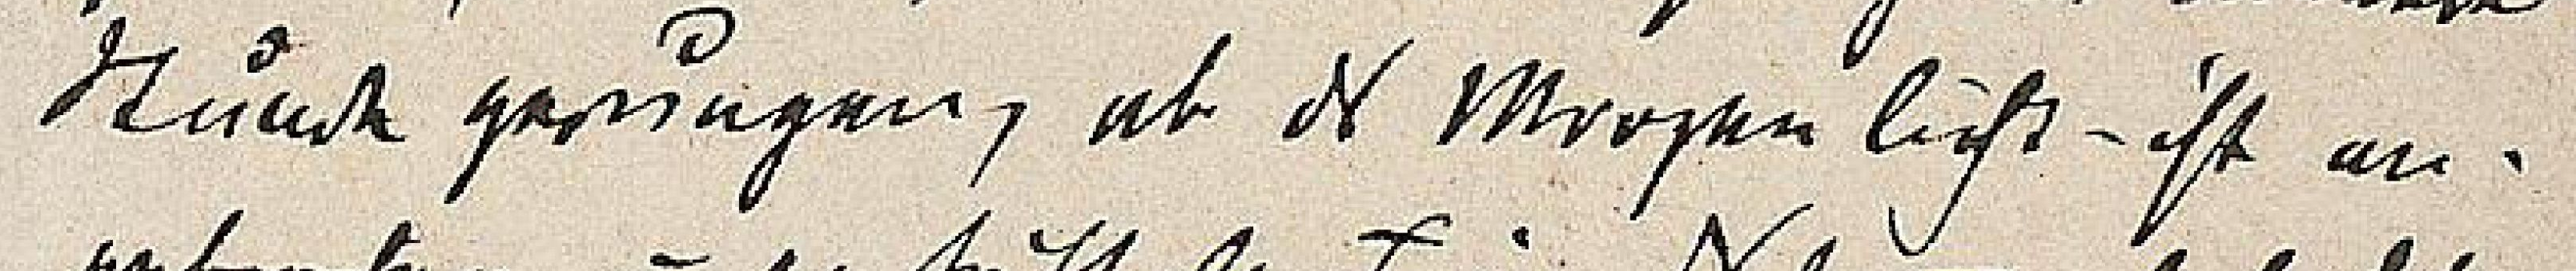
Stunde gerungen, ab ds Morgenlicht ist an¬
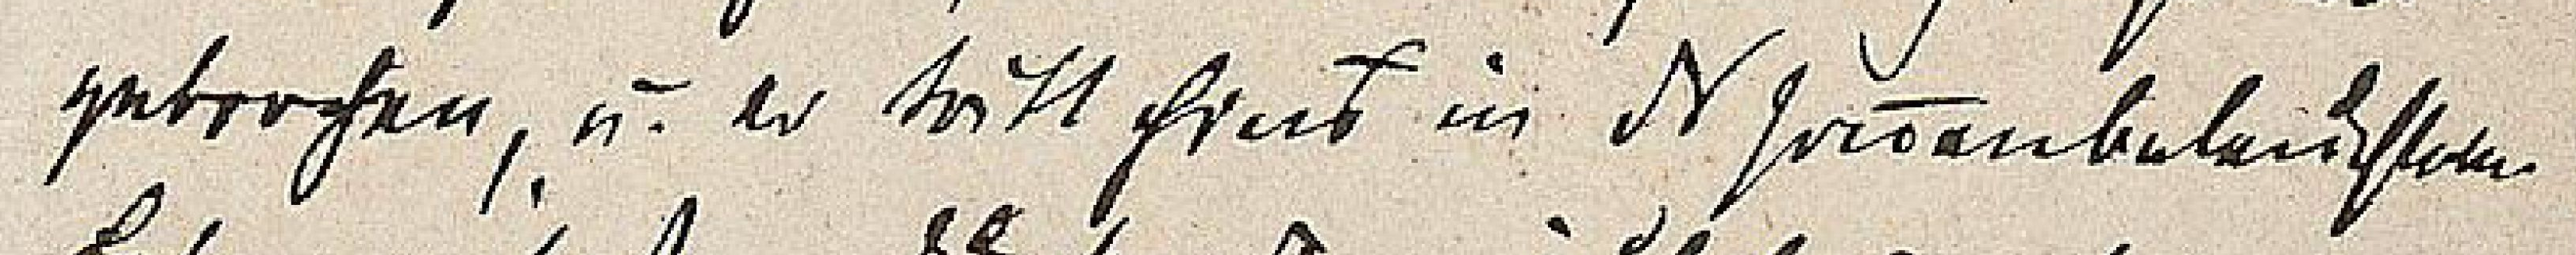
gebrochen, u. er tritt heras ds sonenbeleuchtet
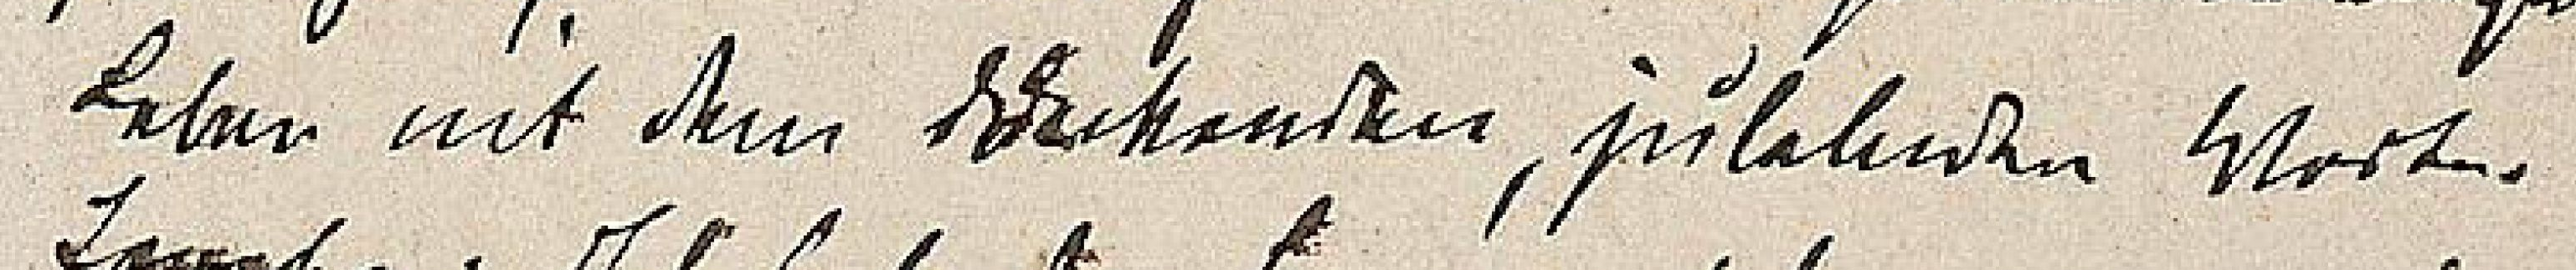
Leben mit dem dankenden, jubelnden Worte
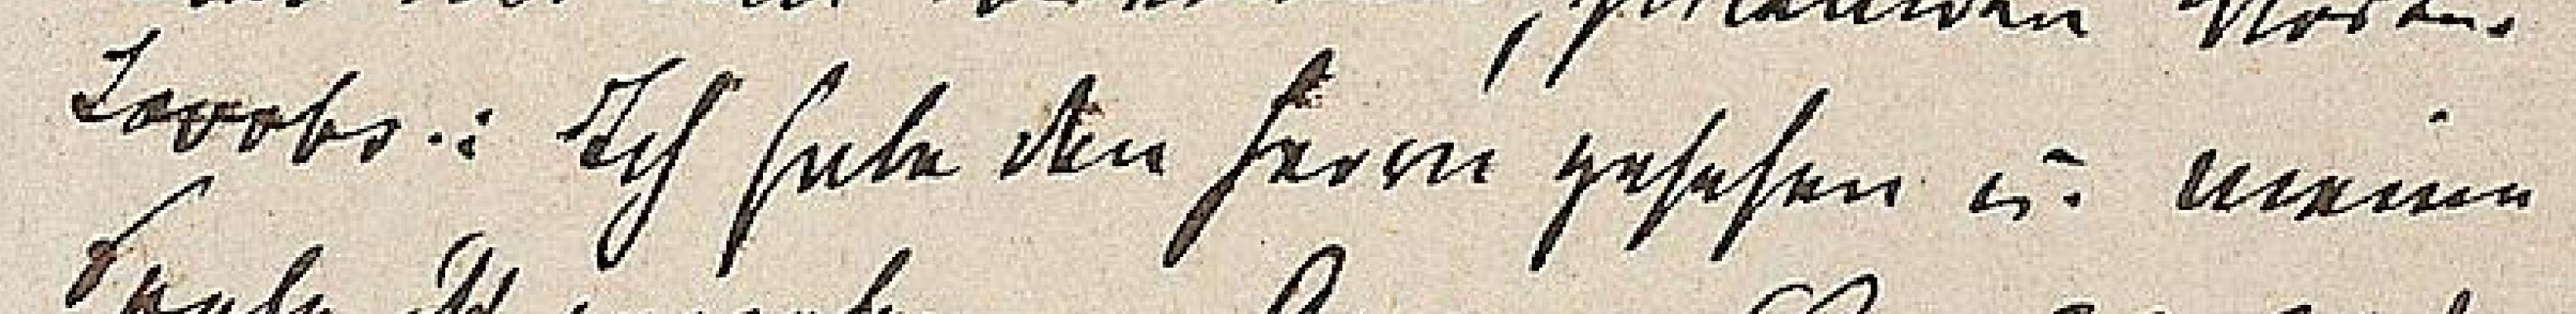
Jacobs: ich habe den Herrn gesehen u. meine
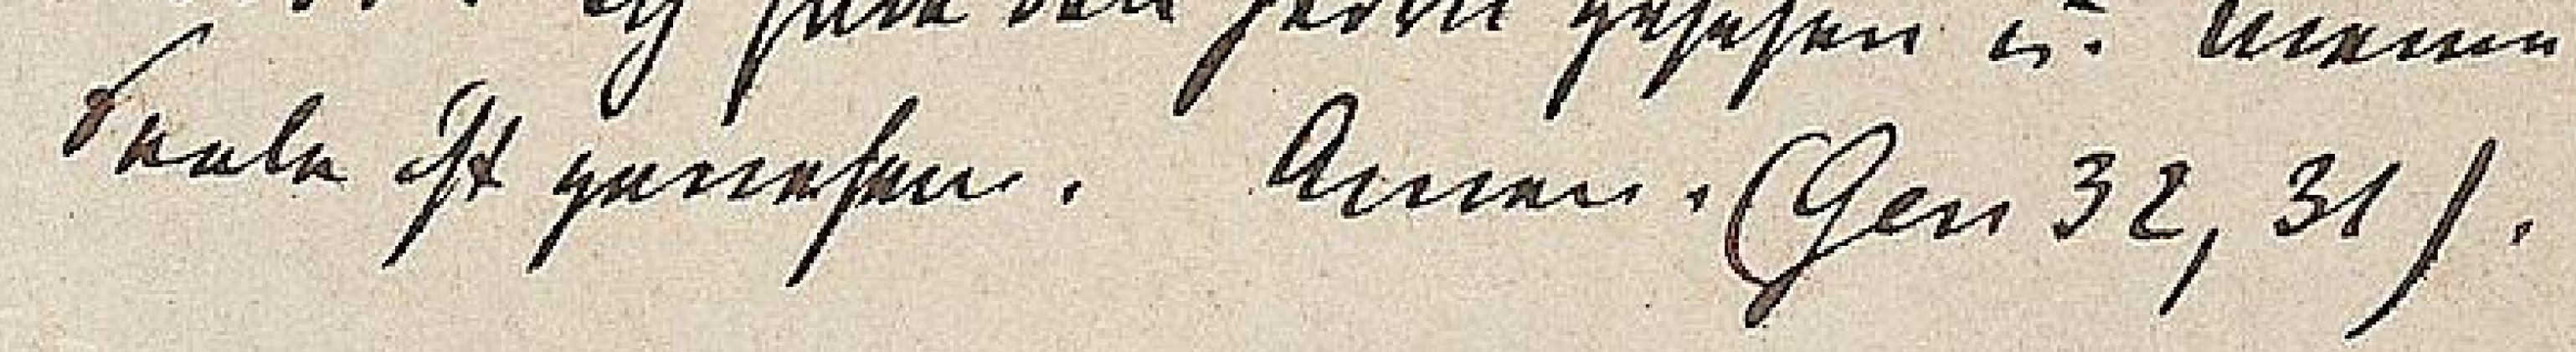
Seele ist genesen. Amen. (Gen 32,31).
